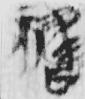禱
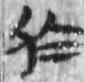於
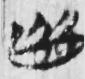○（絕）
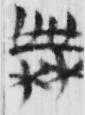無
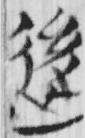○（後）
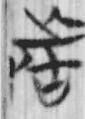者
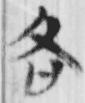各
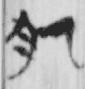肥
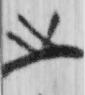之
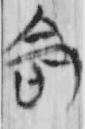命
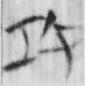攻
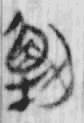解
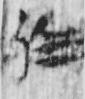於
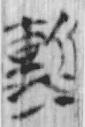漸
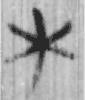木
